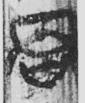君
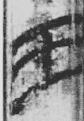王
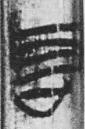○（始）
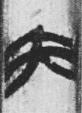內（入）
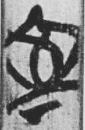室
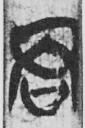君
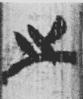之
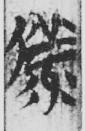備（服）
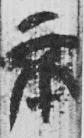不
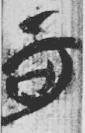可
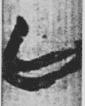㠯
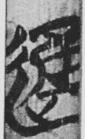進
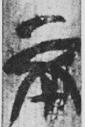不
